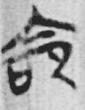命
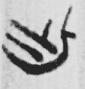此
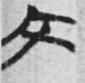文
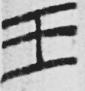王
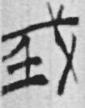城（誠）
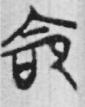命
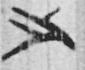之
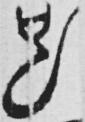也
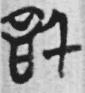○（信）
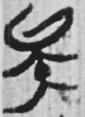矣
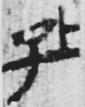孔
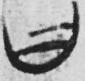曰
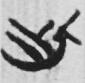此
